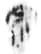宗
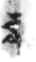不
